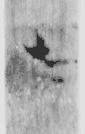十三
